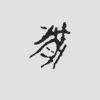歲
